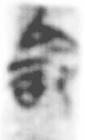命（令）
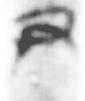尹
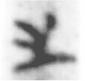之
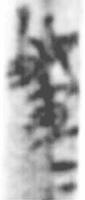○（畋）
